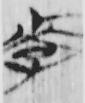李
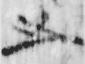之
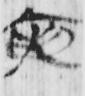寅
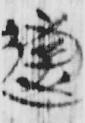遊
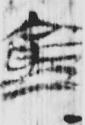倉
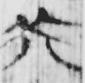癸
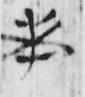未
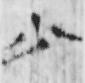少
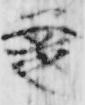妾
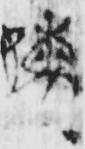媡
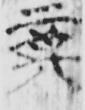奠
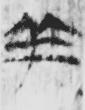羊
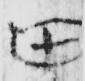甲
